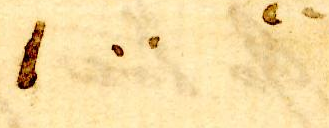1
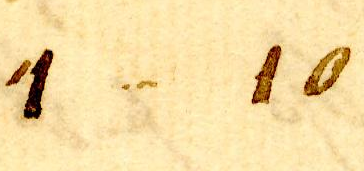1 - 10
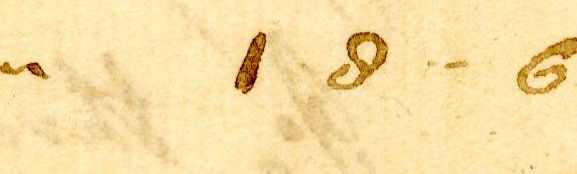- 18 - 6
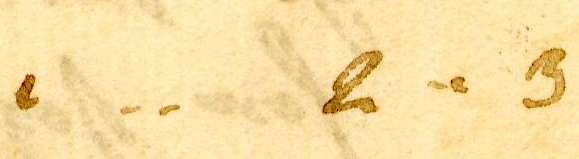- - 2 - 3
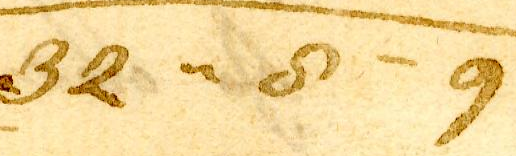32 - 8 - 9
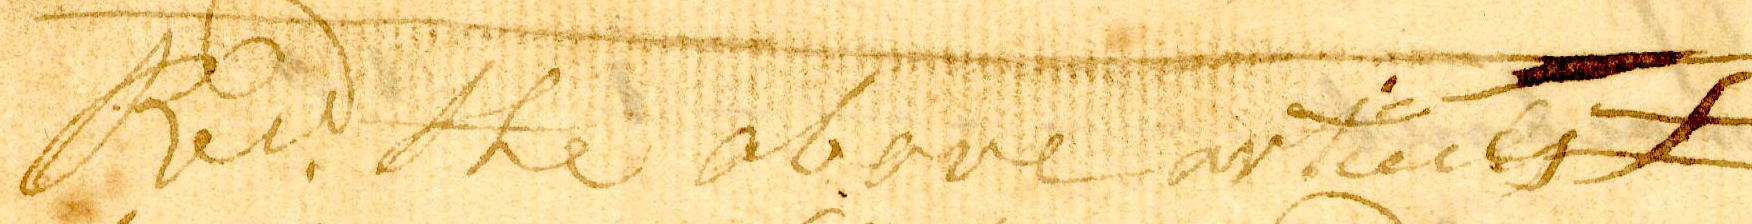Rec^d the above articles
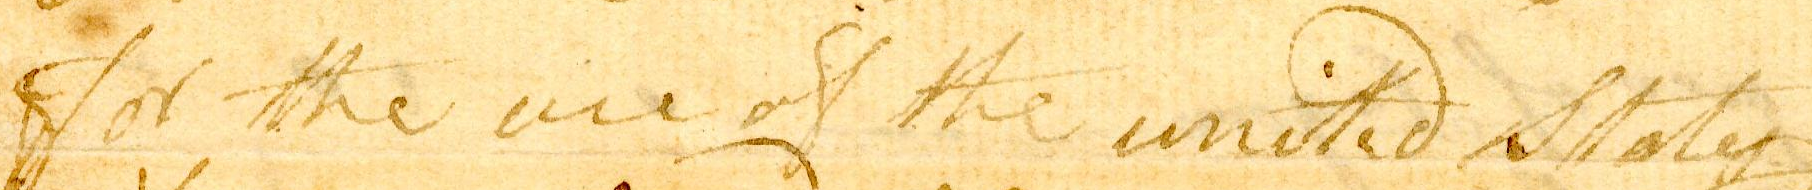for the use of the united States
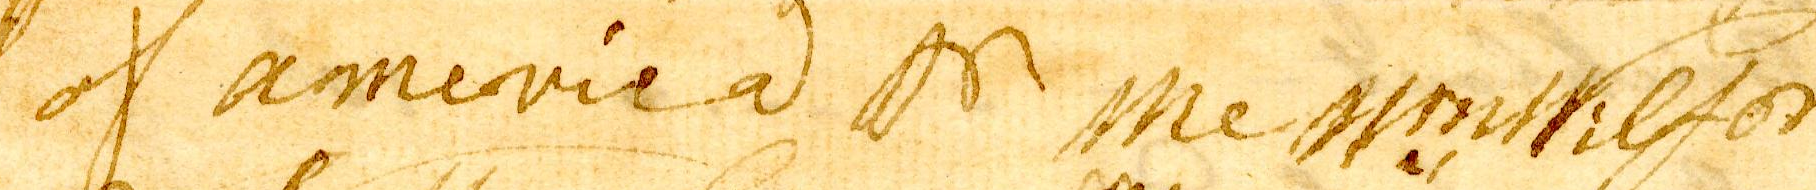of america & M^r W^m Wilson
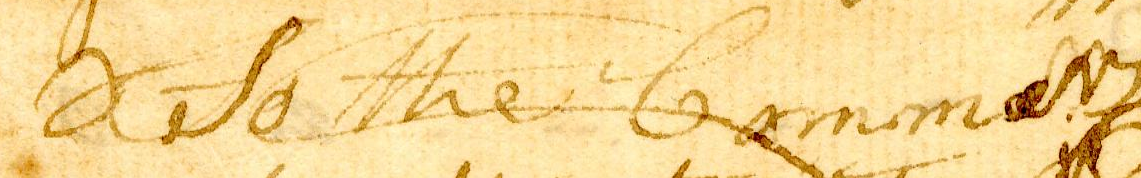So the Comm^rs
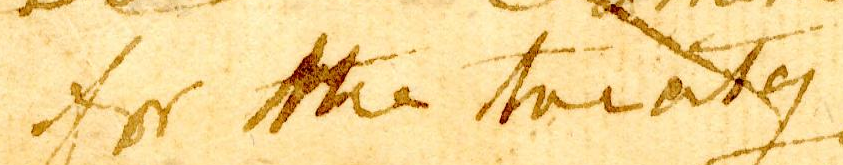for the treaty
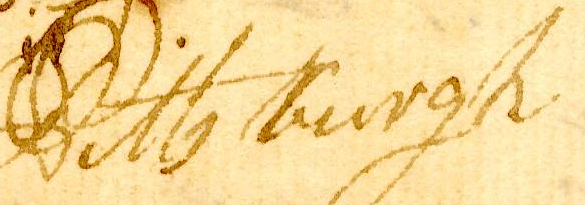Pittsburgh
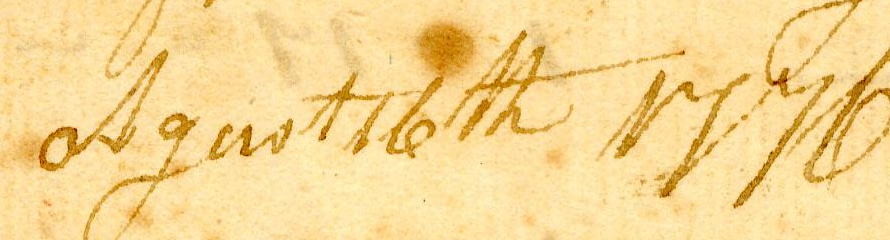Agust 16th 1776
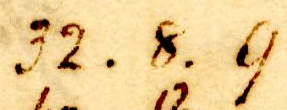32.8.9
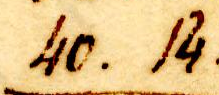40. 14.
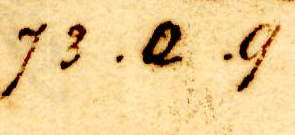73.0.9
